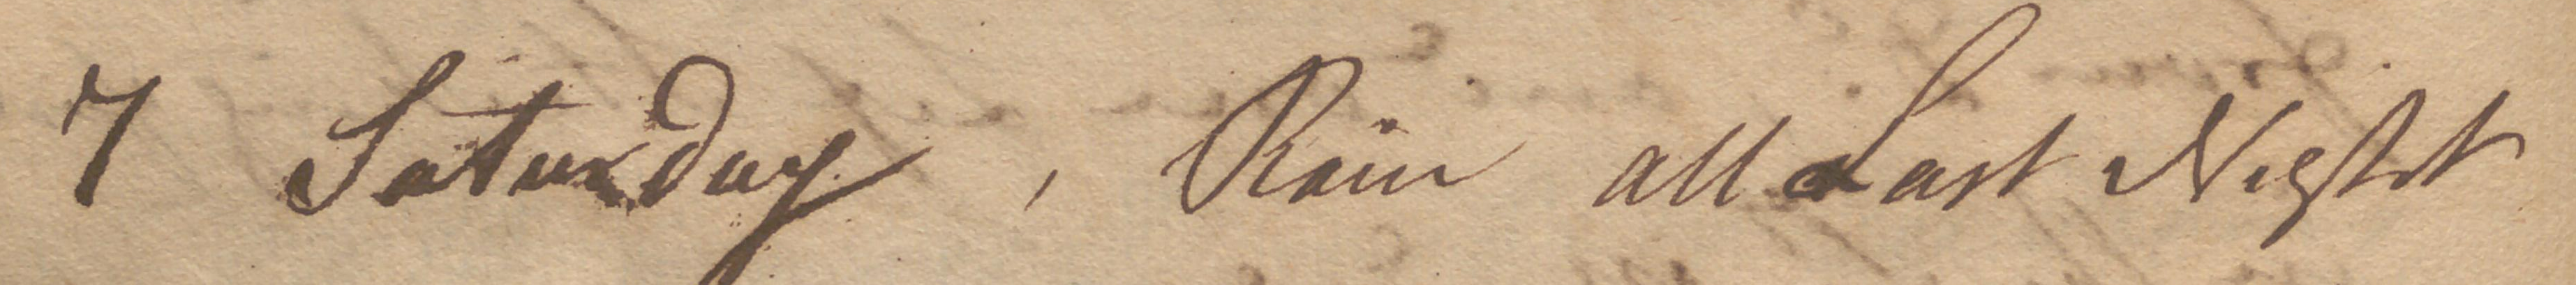7 Saturday, Rain all Last Night
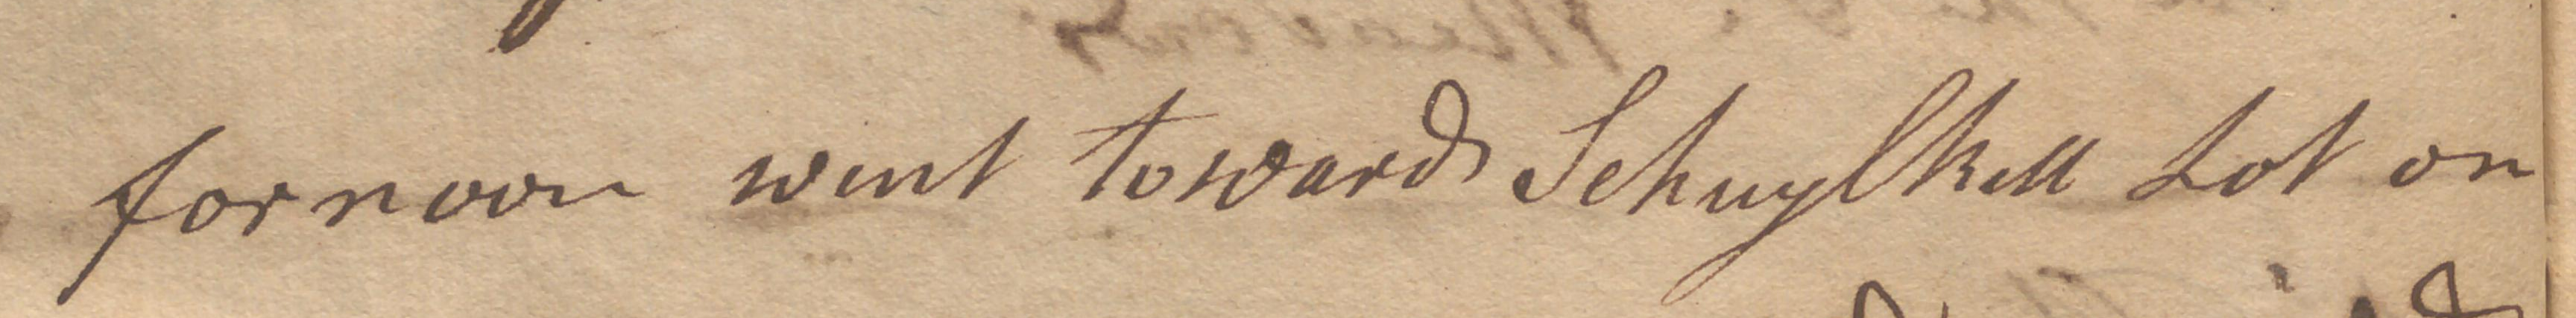fornoon went toward Schuylkill Lot on
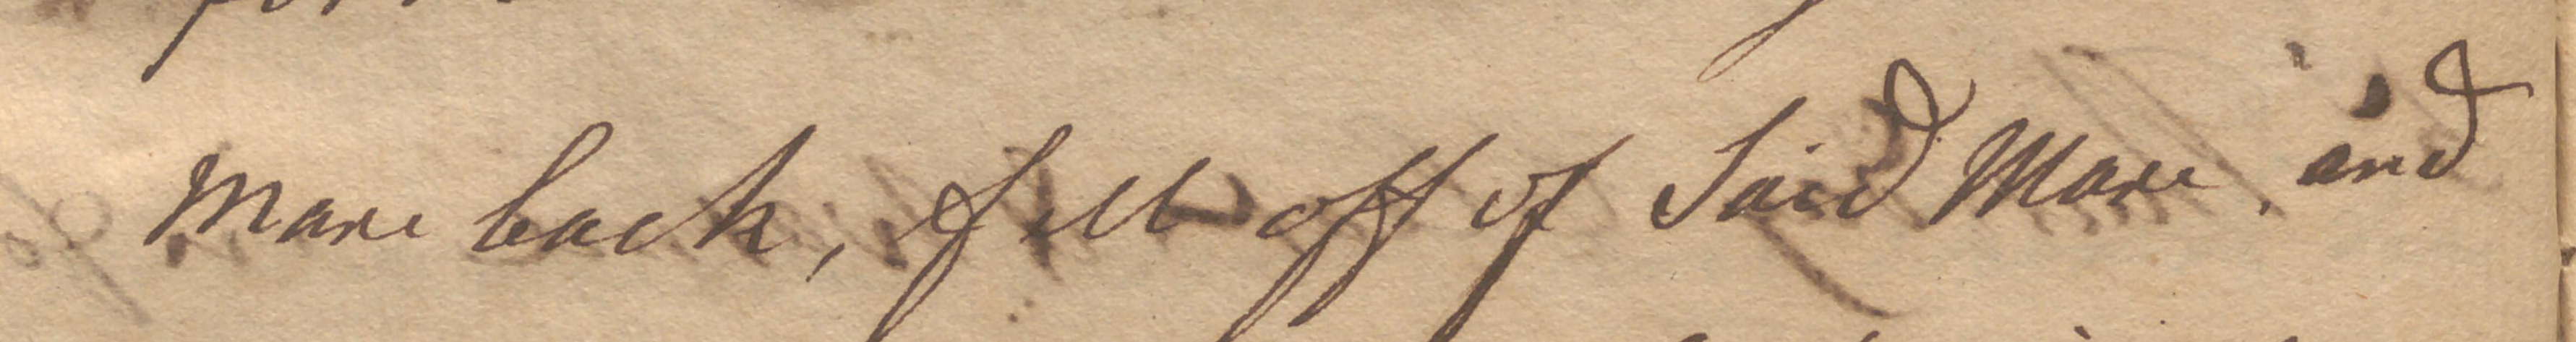Mareback, fell off of Said Mare and
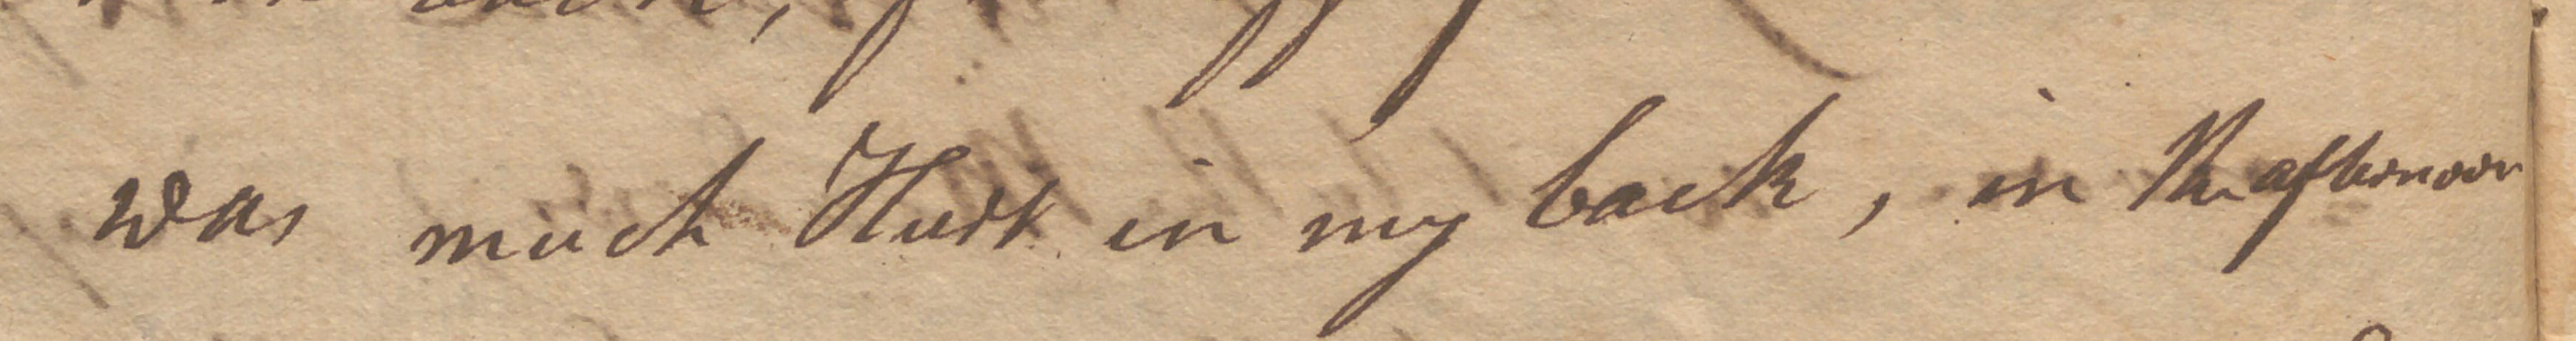was much Hurt in my back, in the afternoon
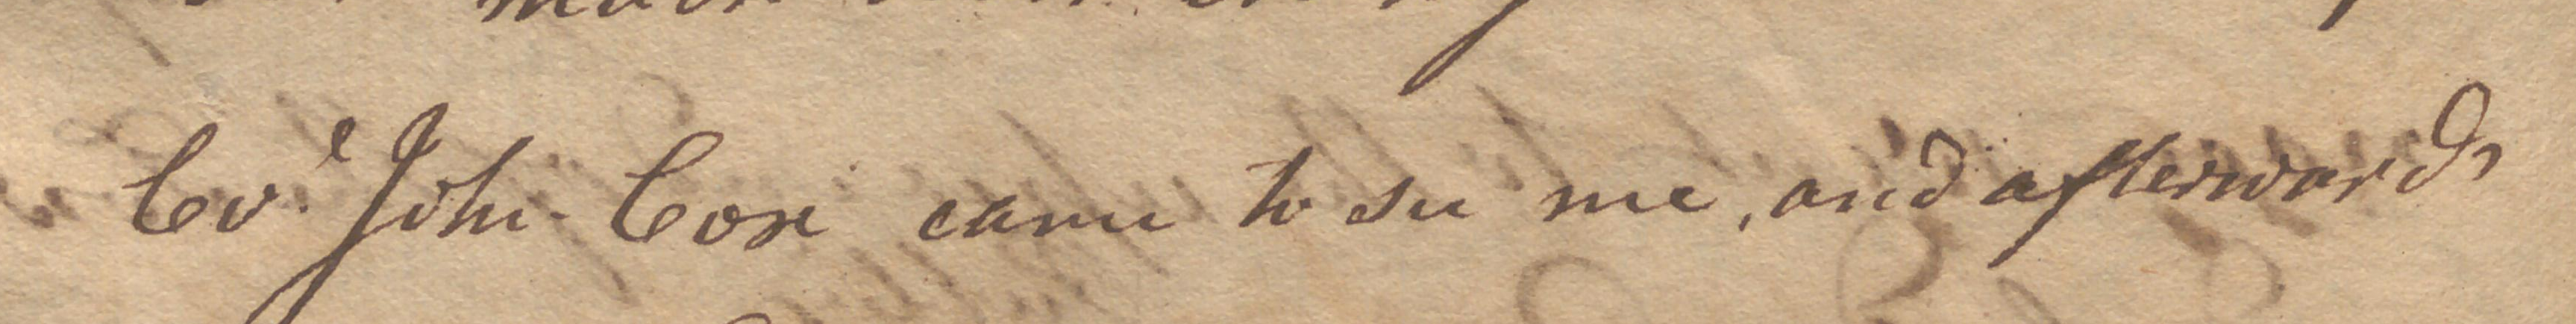Co^l. John Cox, came to see me, and afterwards
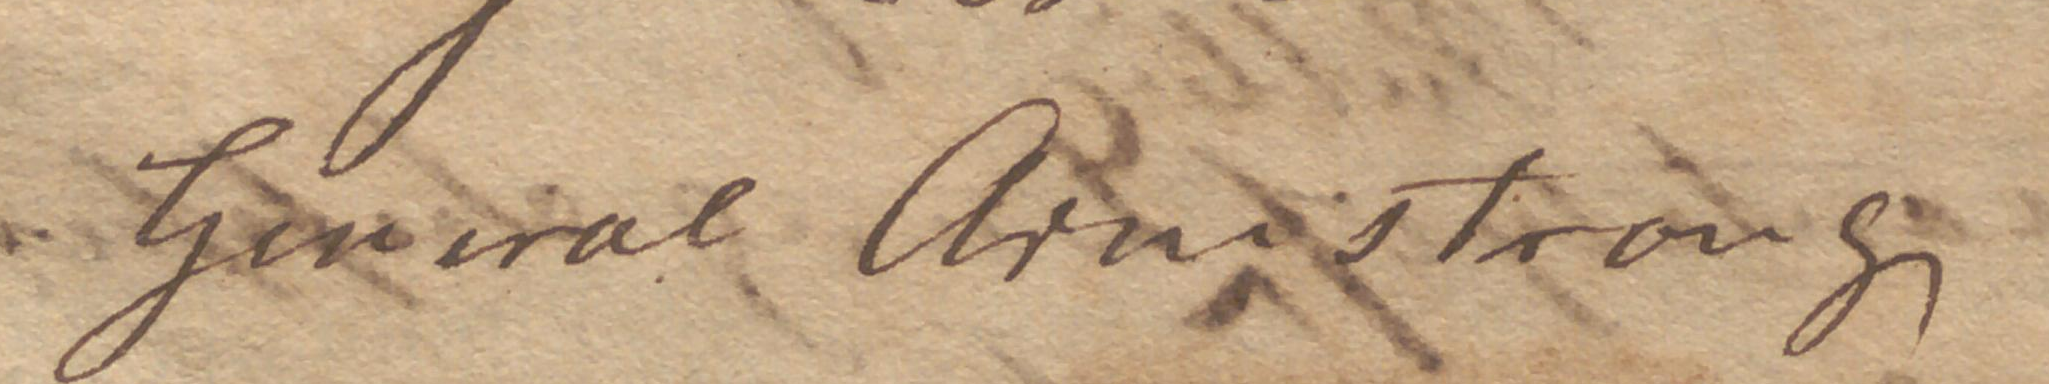General Armstrong
